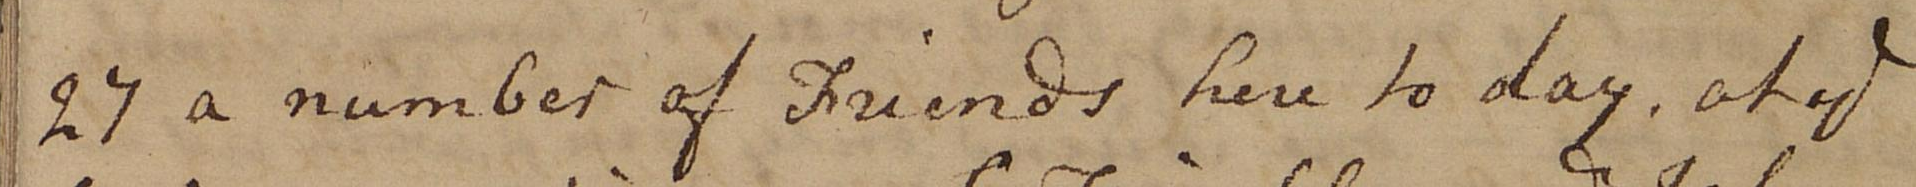27 a number of Friends here to day, at y^e
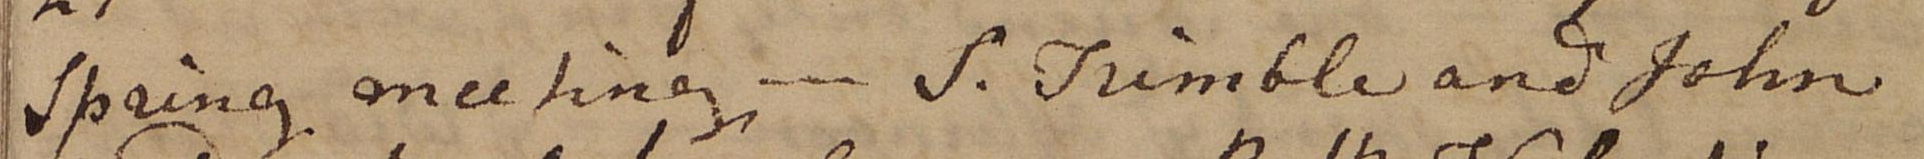spring meeting- S. Trimble and John
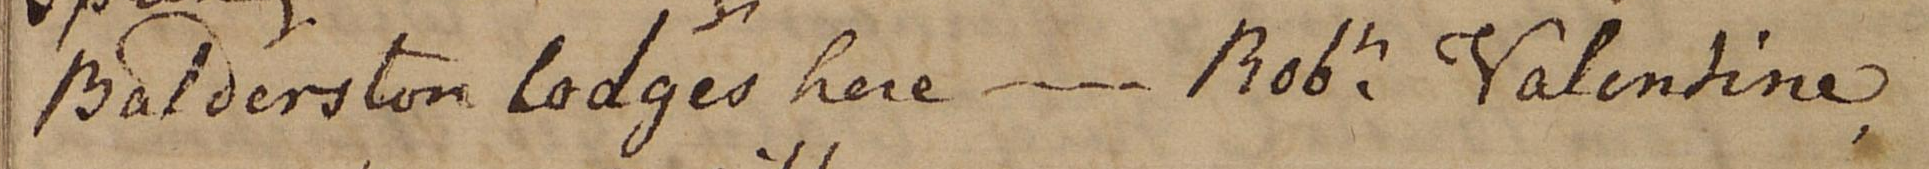Balderston lodges here- Rob^t. Valentine,
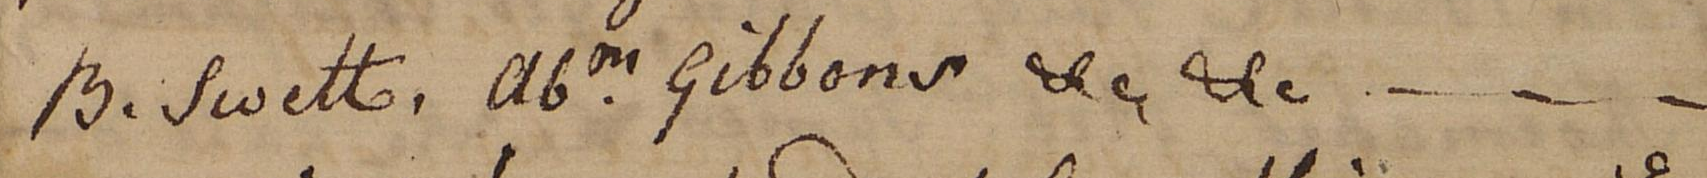B. Swett, Ab^m. Gibbons &c &c--
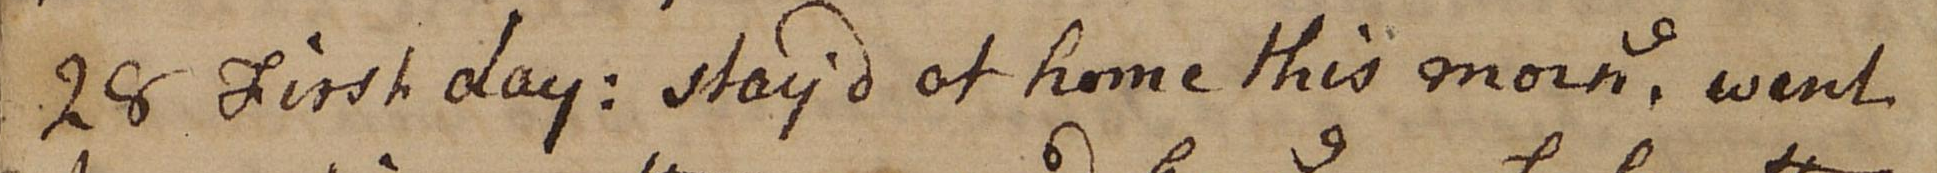28 First day: stay'd at home this morn^g. went
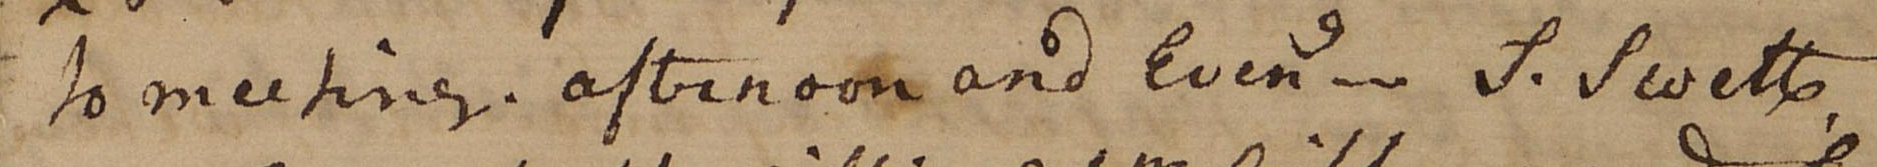to meeting. afternoon and Even^g- S. Swett,
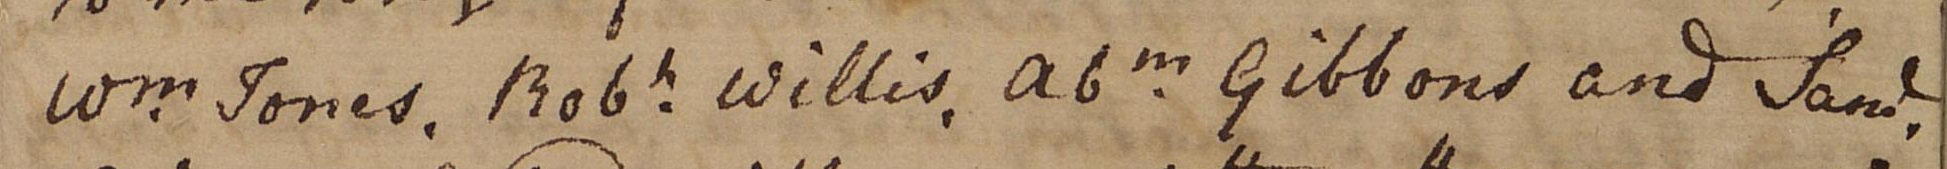W^m. Jones, Rob^t. Willis, Ab^m. Gibbons and Sam^l.
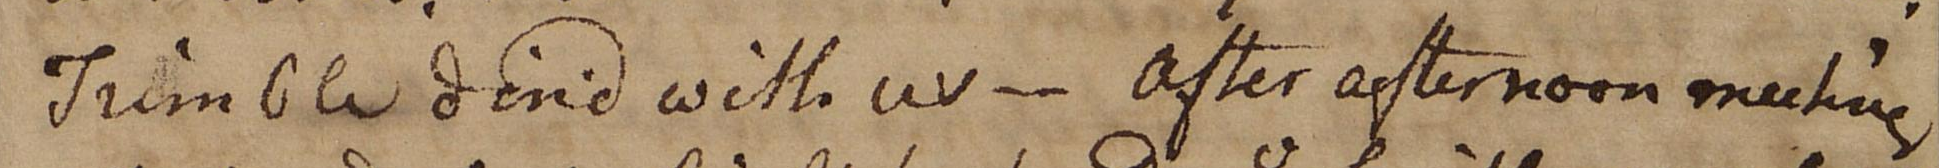Trimble din'd with us- After afternoon meeting
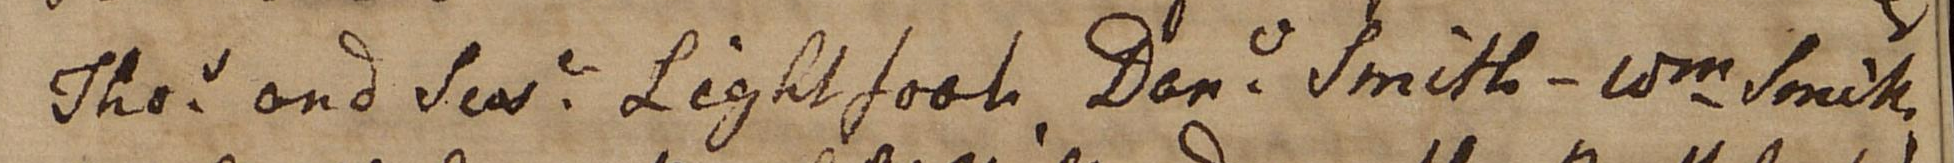Tho^s. and Seas^l. Lightfoot, Dan^y. Smith- W^m. Smith,
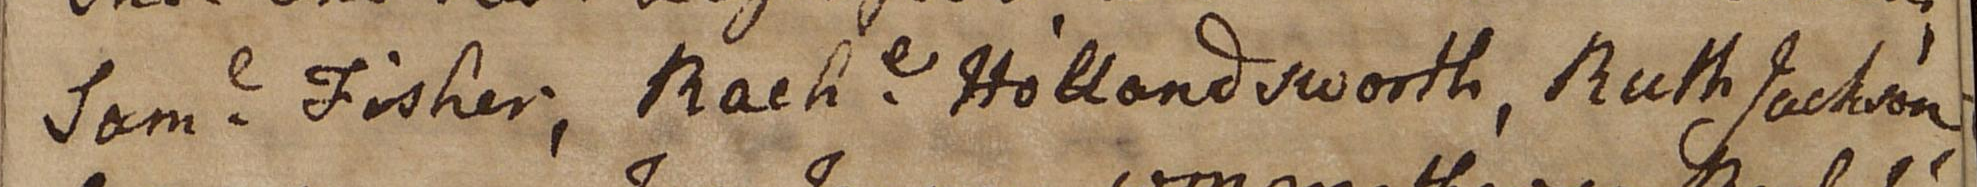Sam^l. Fisher, Rach^l. Hollandsworth, Ruth Jackson,
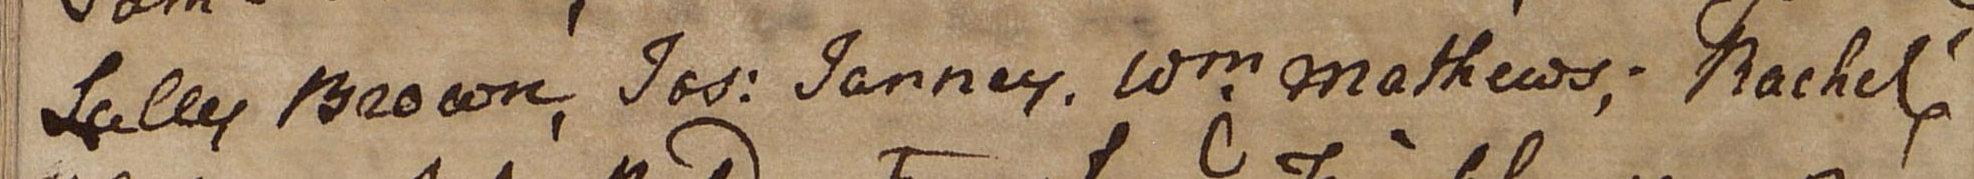Sally Brown, Jos: Janney, W^m. Mathews; Rachel
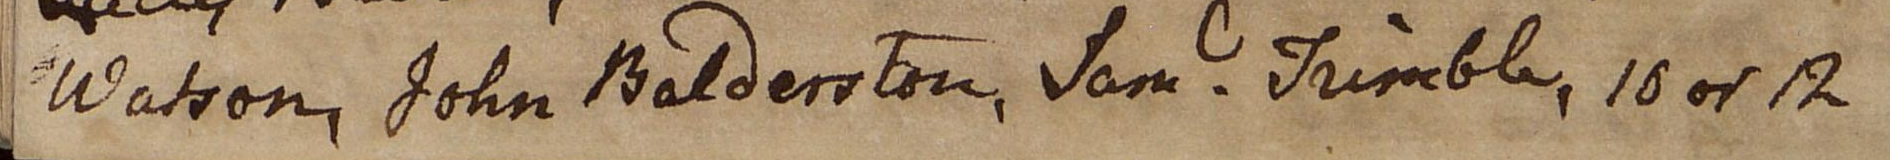Watson, John Balderston, Sam^l. Trimble, 10 or 12
